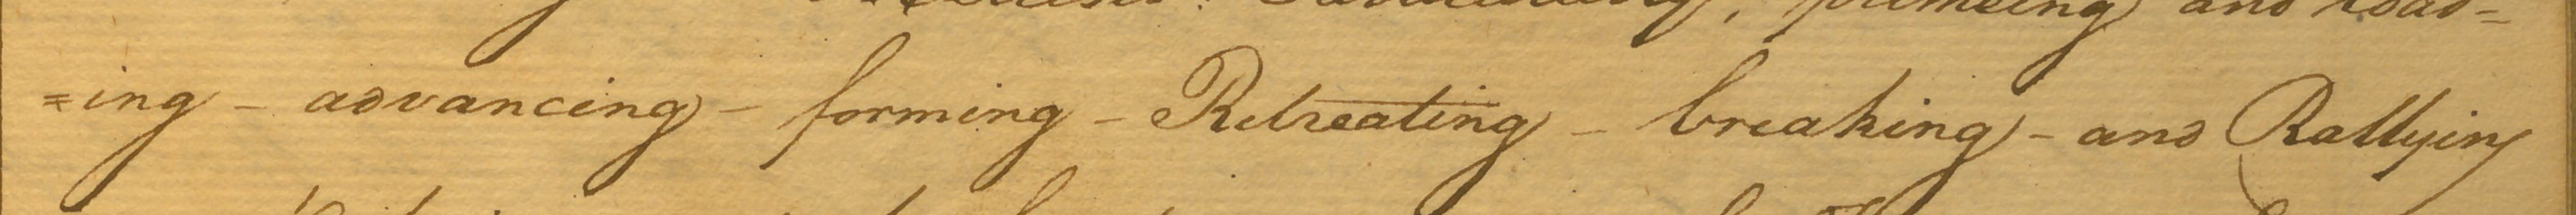-ing- advancing- forming- Retreating- breaking- and Rallying
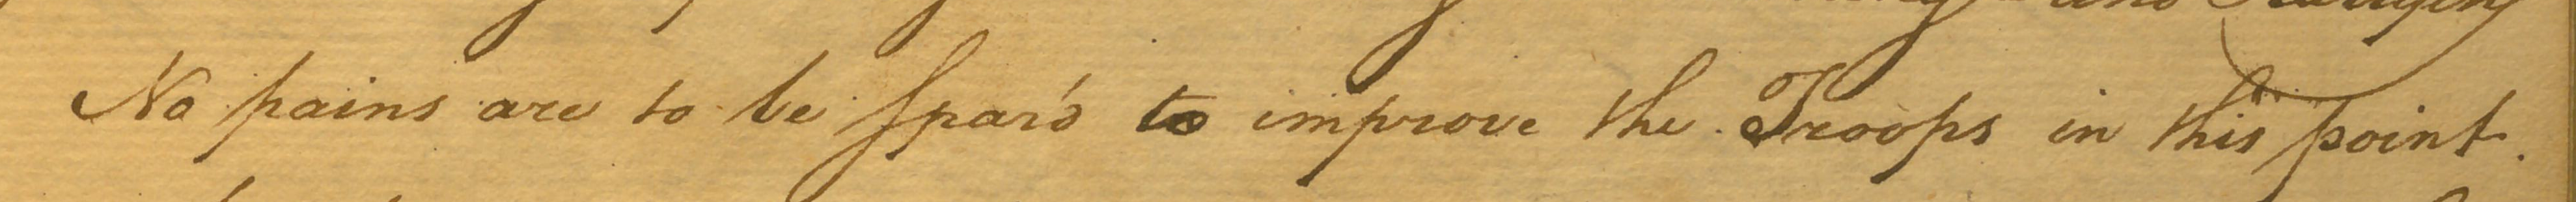No pains are to be spar'd to improve the Troops in this point.
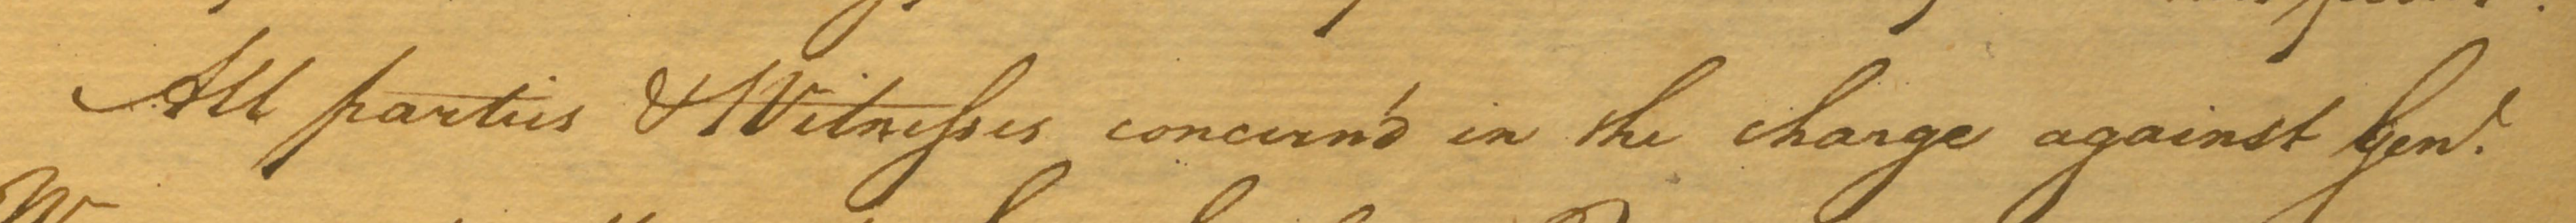All parties & Witnesses concern'd in the charge against Gen^l.
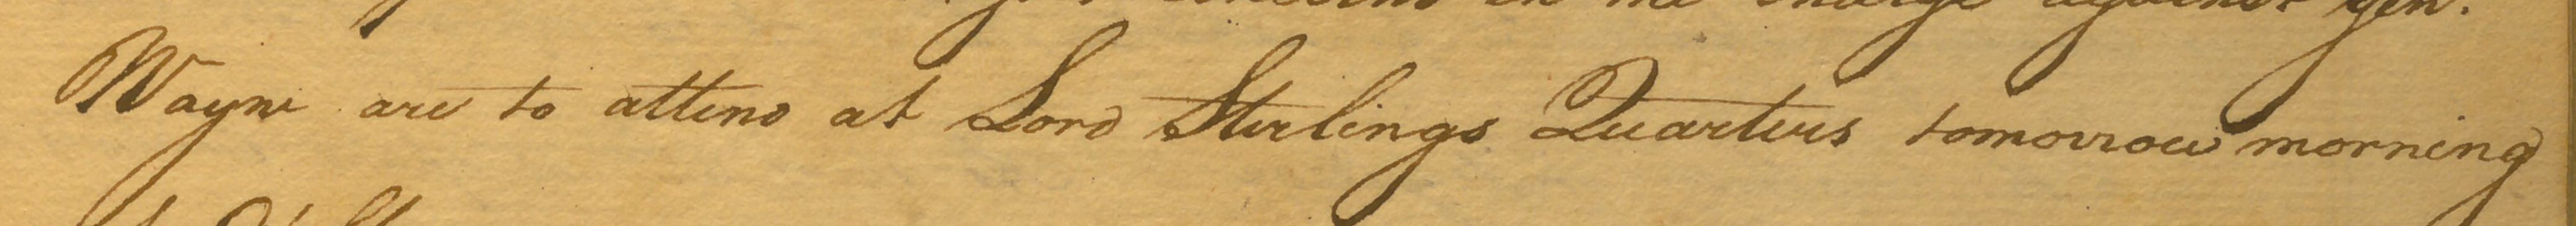Wayne are to attend at Lord Sterlings Quarters tomorrow morning
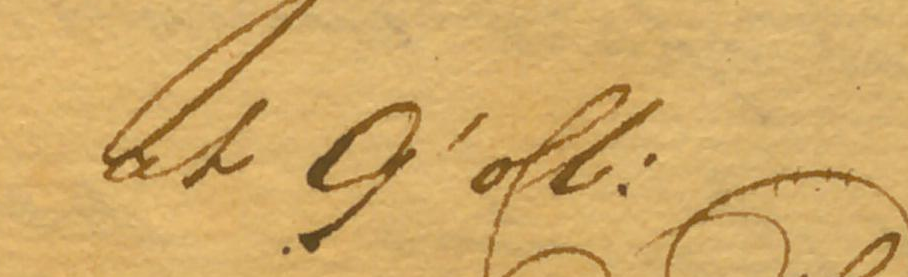at 9 'oCl:
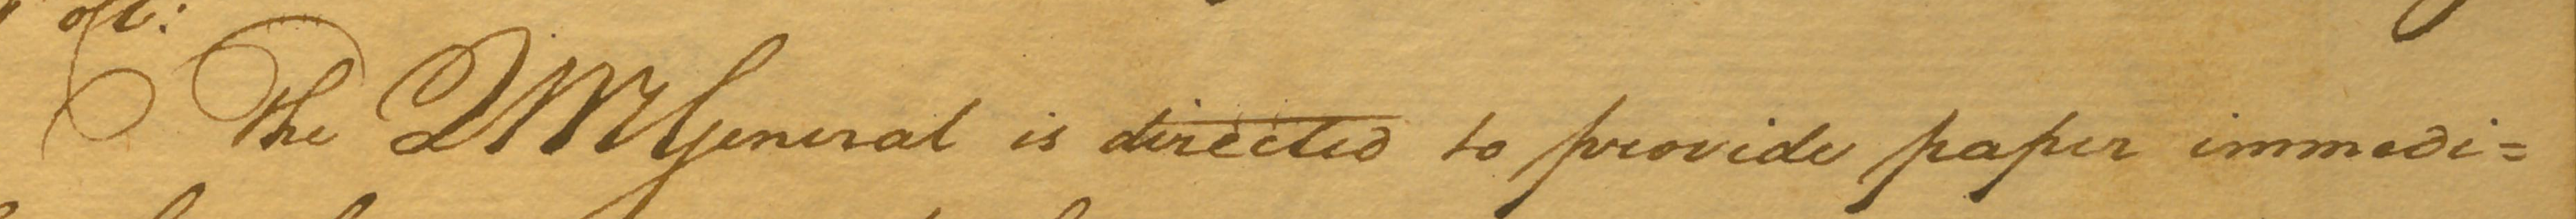The QM General is directed to provide paper immedi-
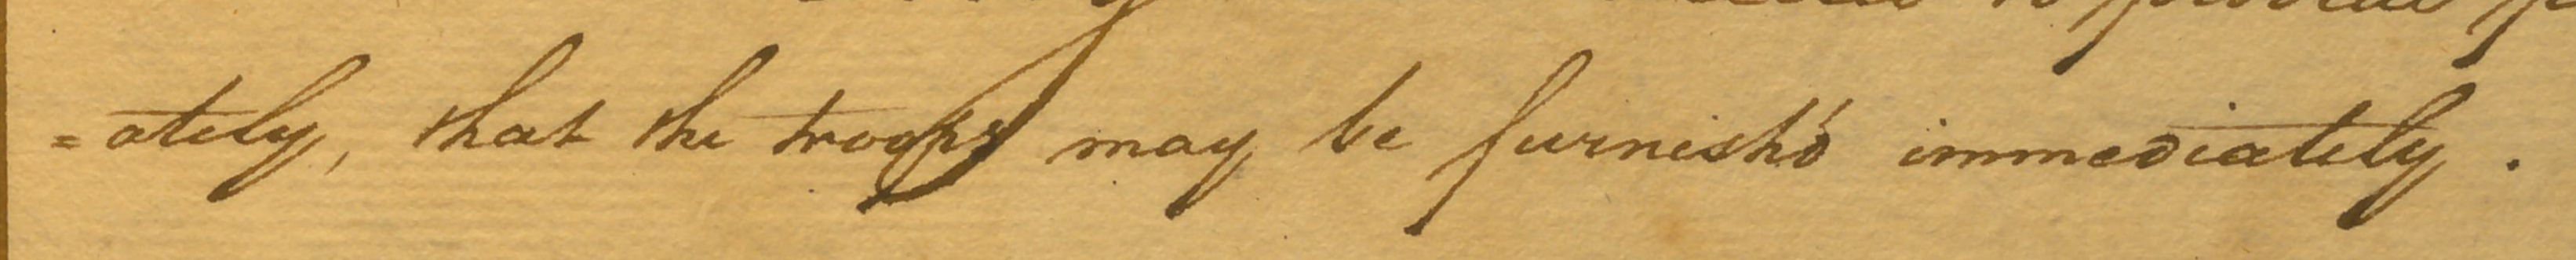-ately, that the troops may be furnish'd immediately.
